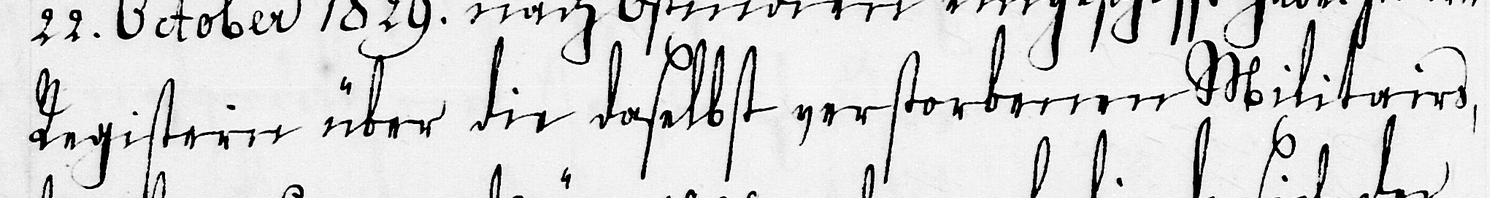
Registern über die daselbst verstorbenen Militairs,
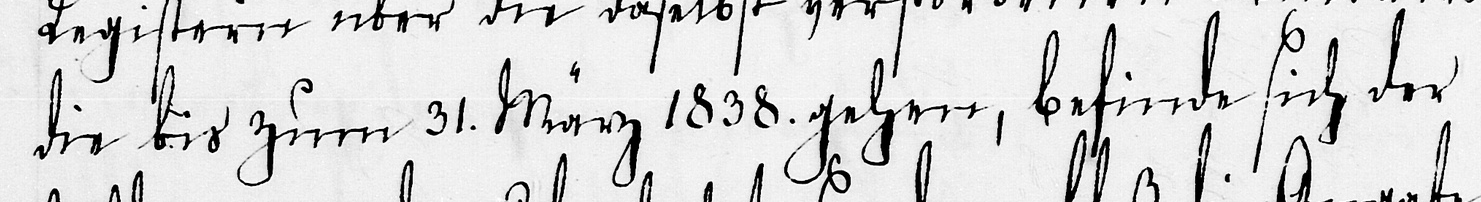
die bis zum 31. März 1838. gehen, befinde sich der
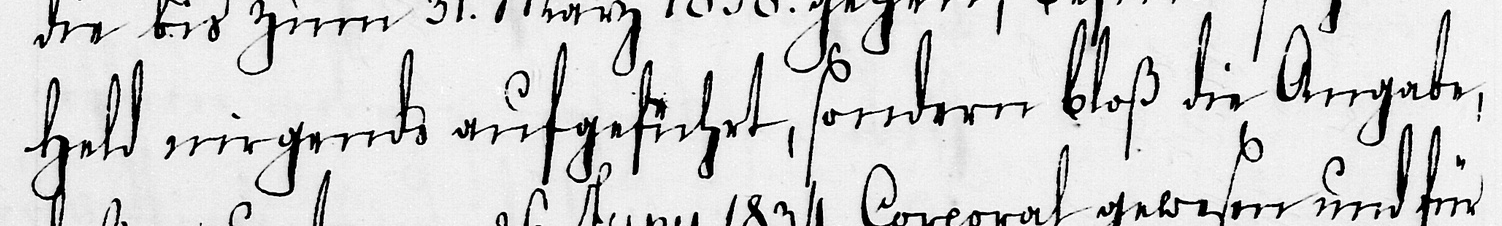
Held nirgends aufgeführt, sondern bloß die Angabe,
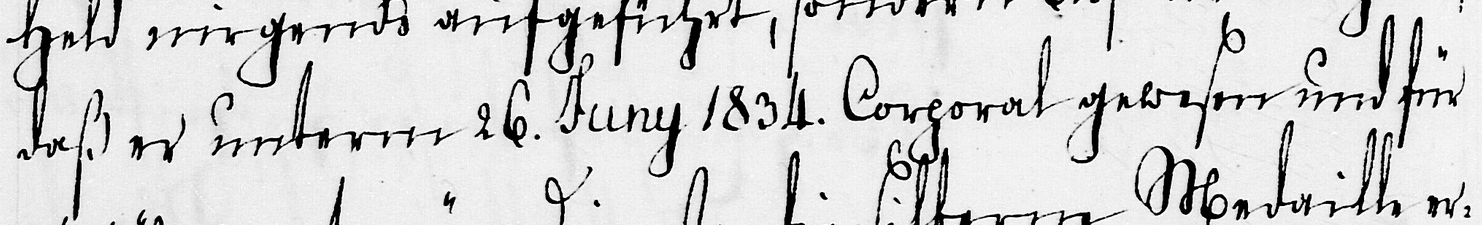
daß er unterm 26. Juny 1834. Corporal gewesen und für
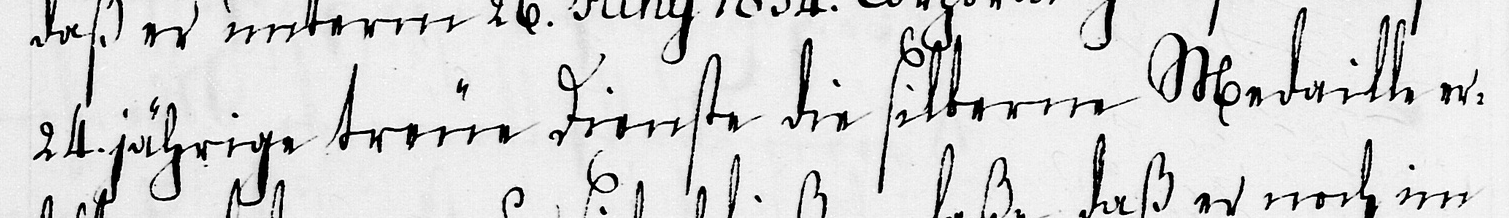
24.jährige treue Dienste die silberne Medaille e¬
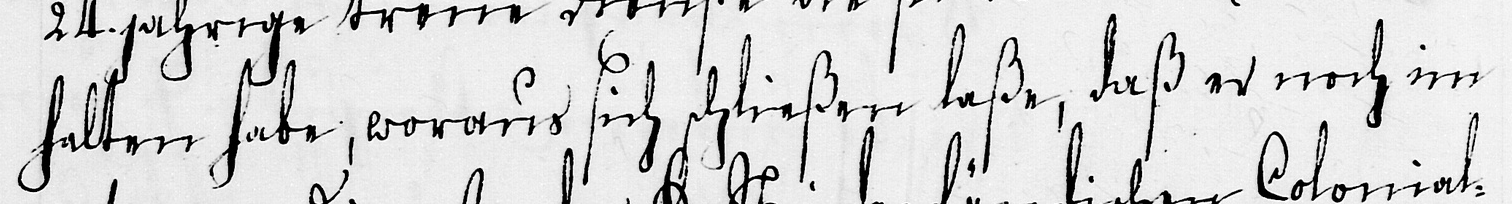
rhalten habe, woraus sich schließen laße, daß er noch im
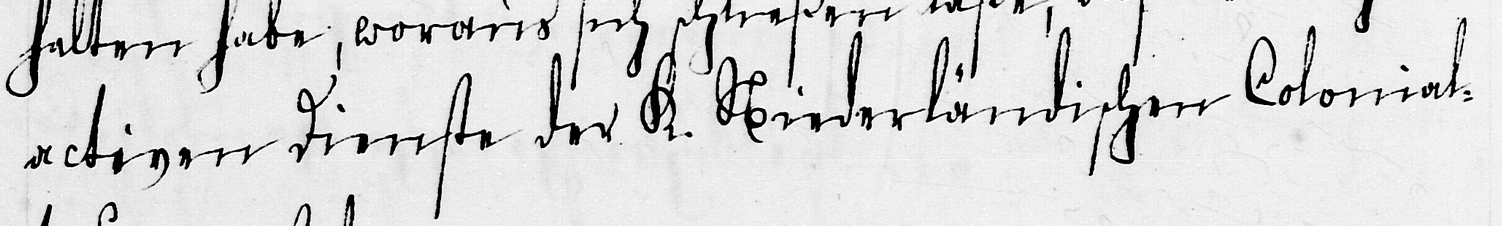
activen Dienste der K. Niederländischen Colonial¬
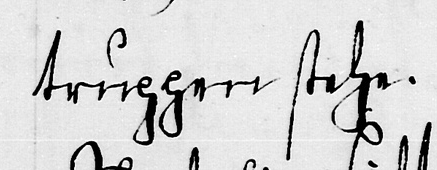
truppen stehe.
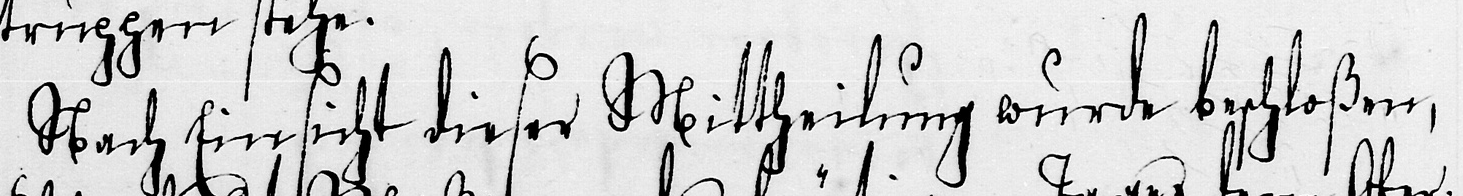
Nach Einsicht dieser Mittheilung wurde beschloßen,
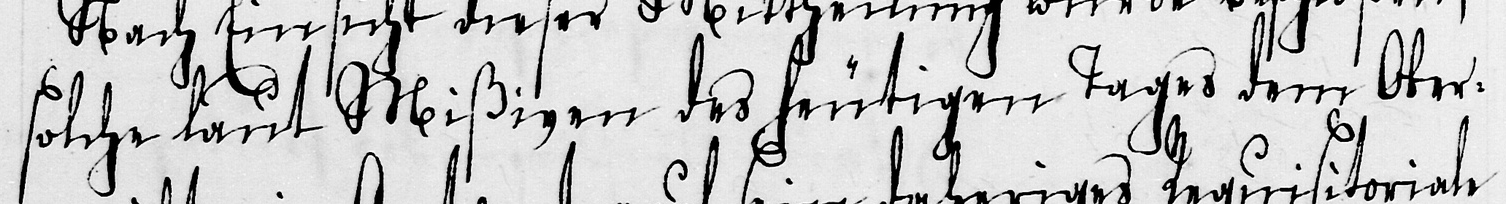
solche laut Mißiven des heutigen Tages dem Ober¬
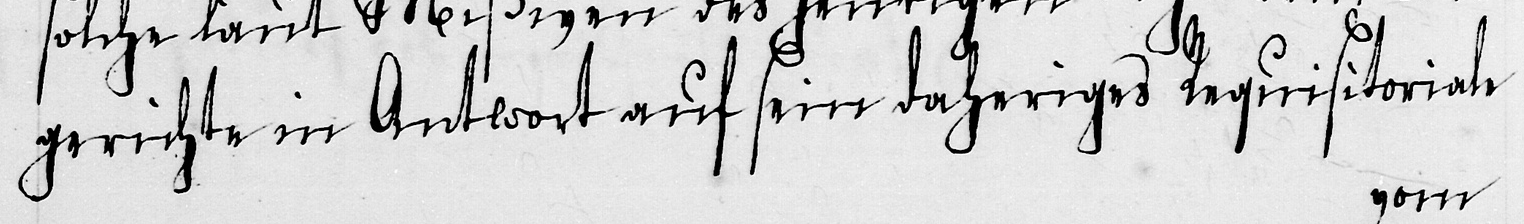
gerichte in Antwort auf sein daheriges Requisitoriale
